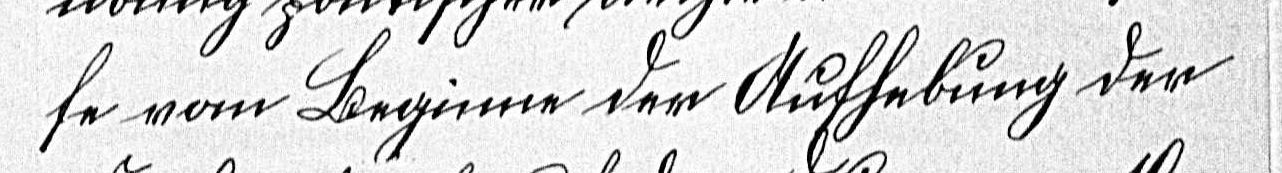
fe vom Beginne der Aufhebung der
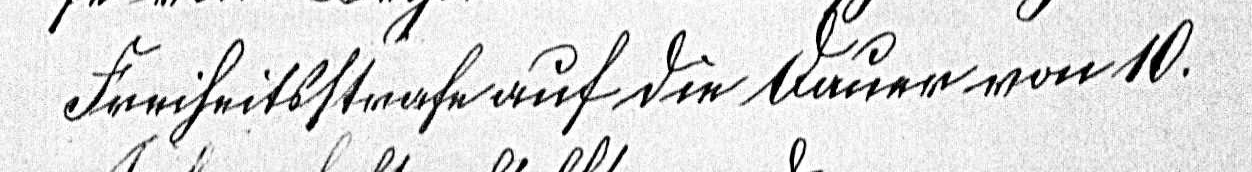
Freiheitsstrafe auf die Dauer von 10.
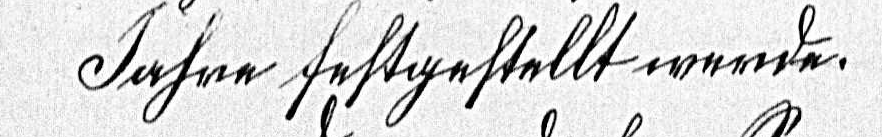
Jahre festgestellt werde.
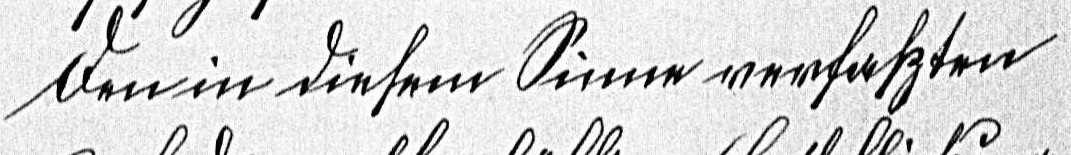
Den in diesem Sinner verfaßten
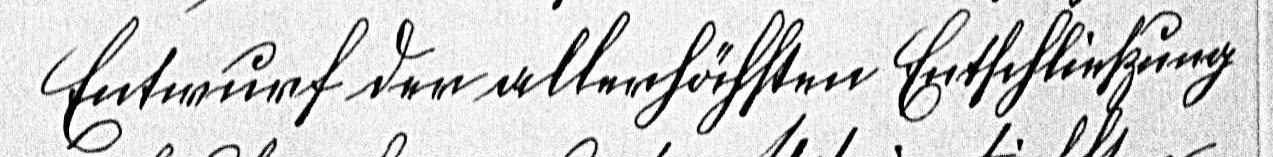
Entwurf der allerhöchsten Entschließung
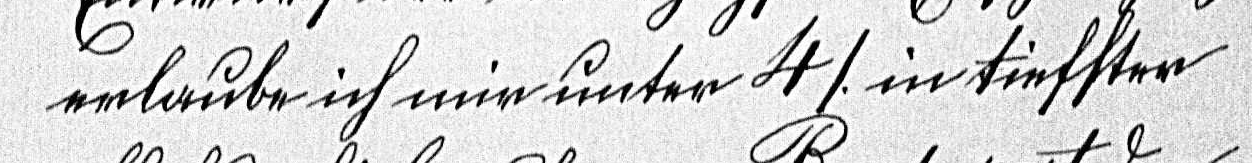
erlabue ich mir unter 4) in tiefster
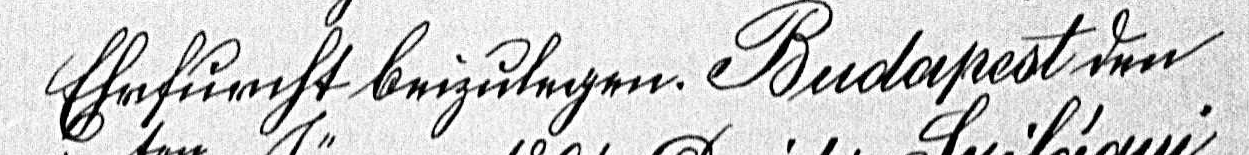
Ehrfurcht beizulegen. Budapest den
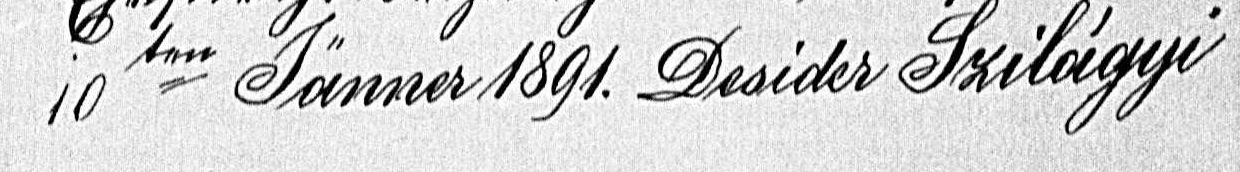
m.p.
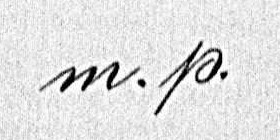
Entschliessung
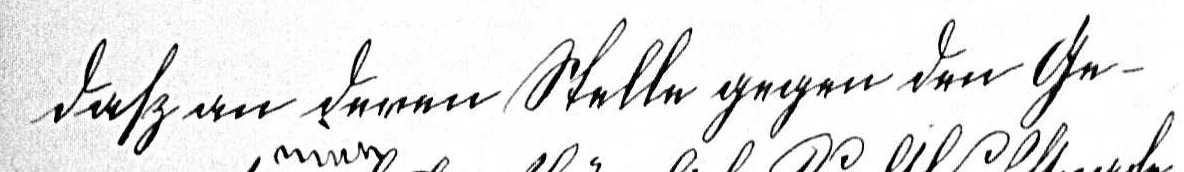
das an deren Stelle gegen den Ge¬
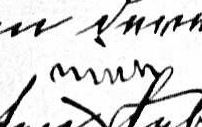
eine
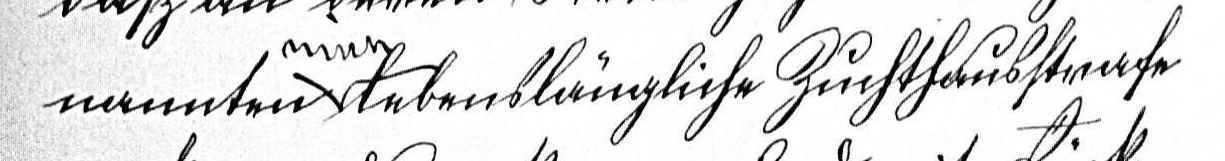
nannten lebenslängliche Zuchthausstrafe
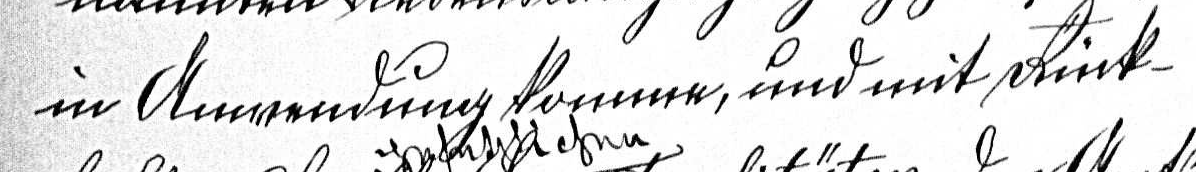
in Anwendung komme, und mit Rück¬
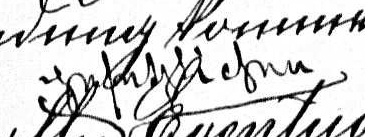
gesetzlichen
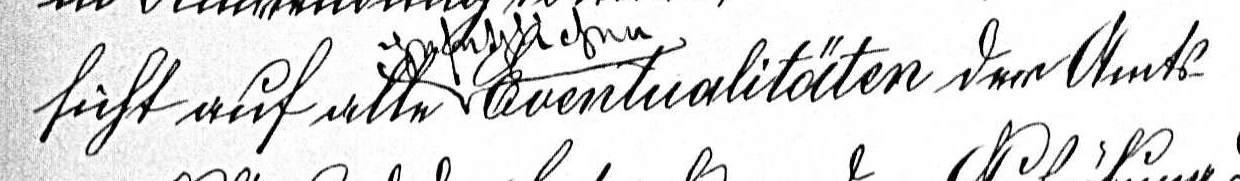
sicht auf alle Eventualitäten der Amt¬
